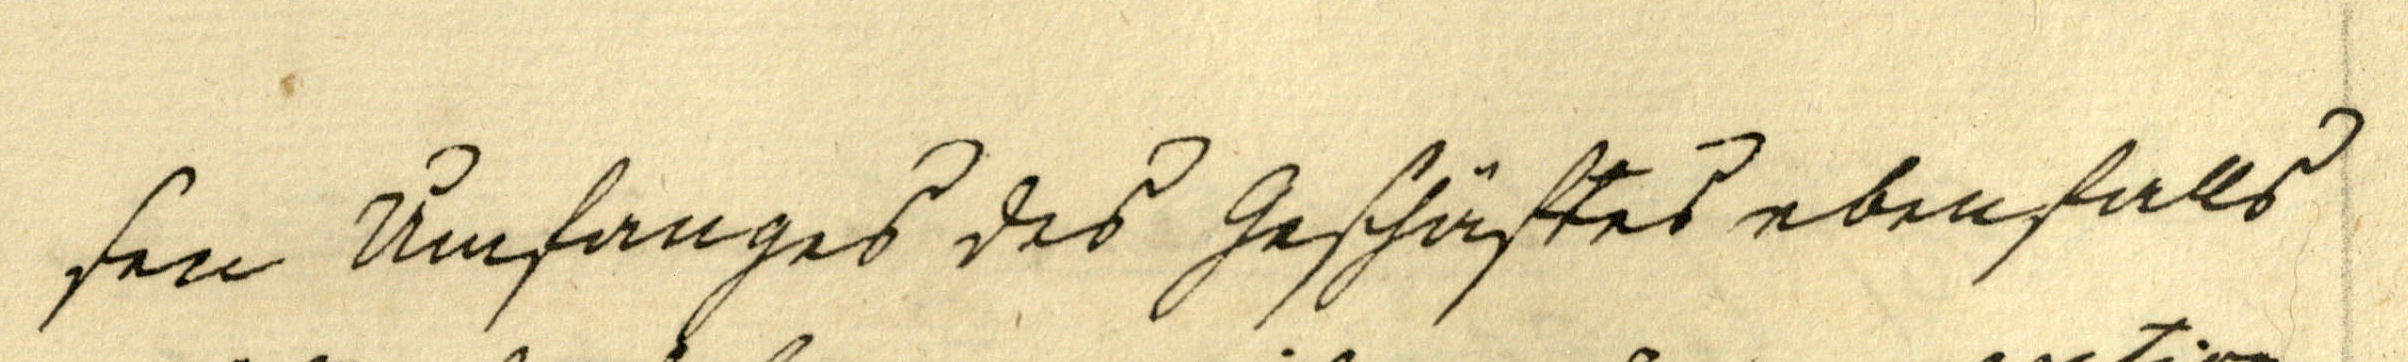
sen Umfanges des Geschäftes ebenfalls
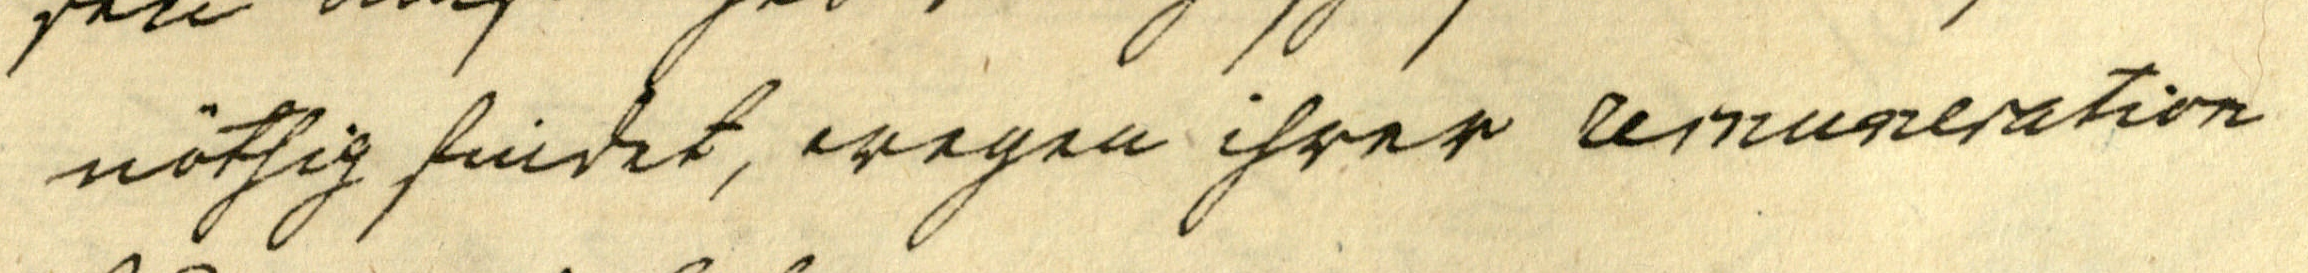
nöthig findet, wegen ihrer remuneration
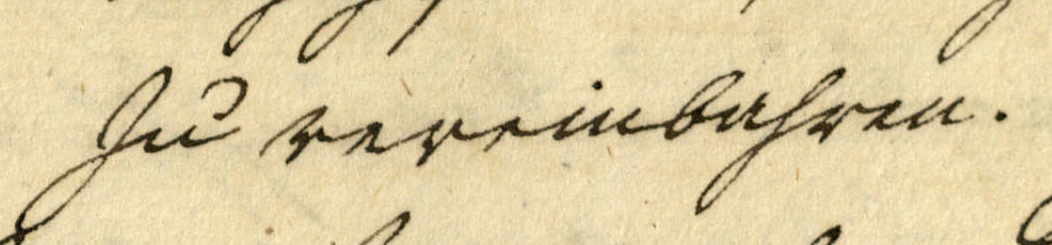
zu vereinbahren.
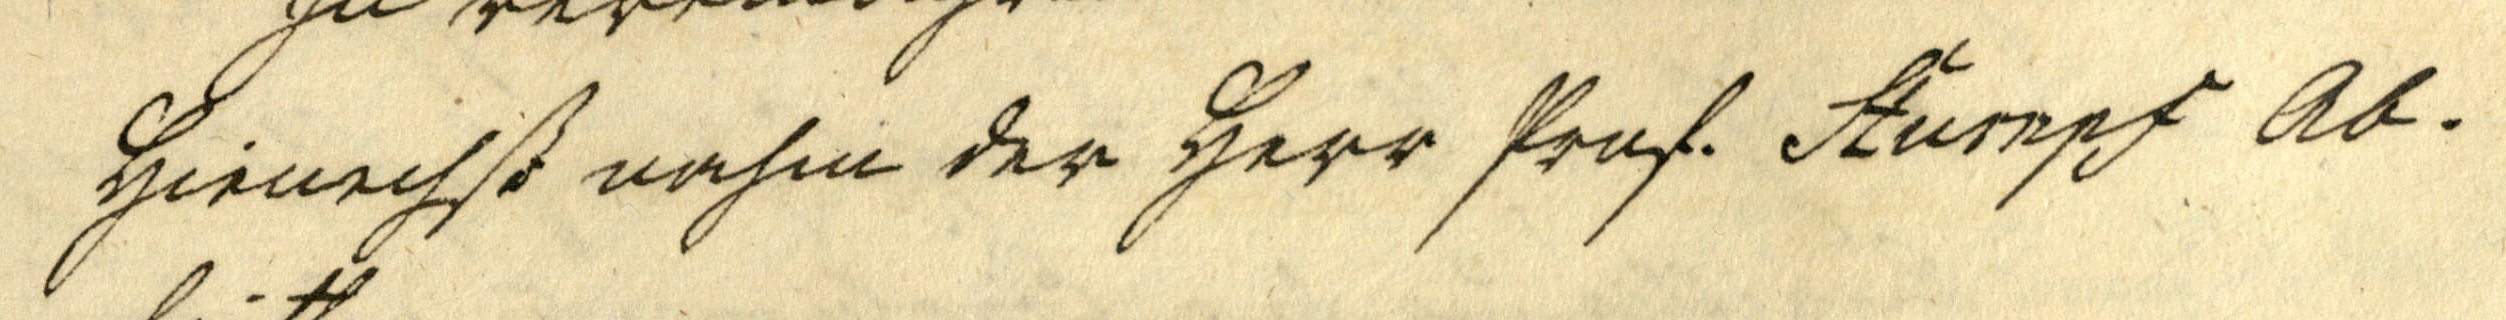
Hienechst nahm der Herr Prof. Stumpf Ab-
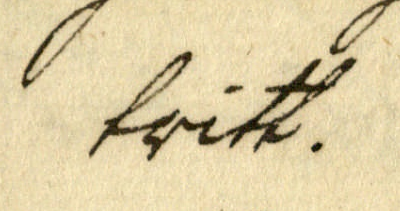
tritt.
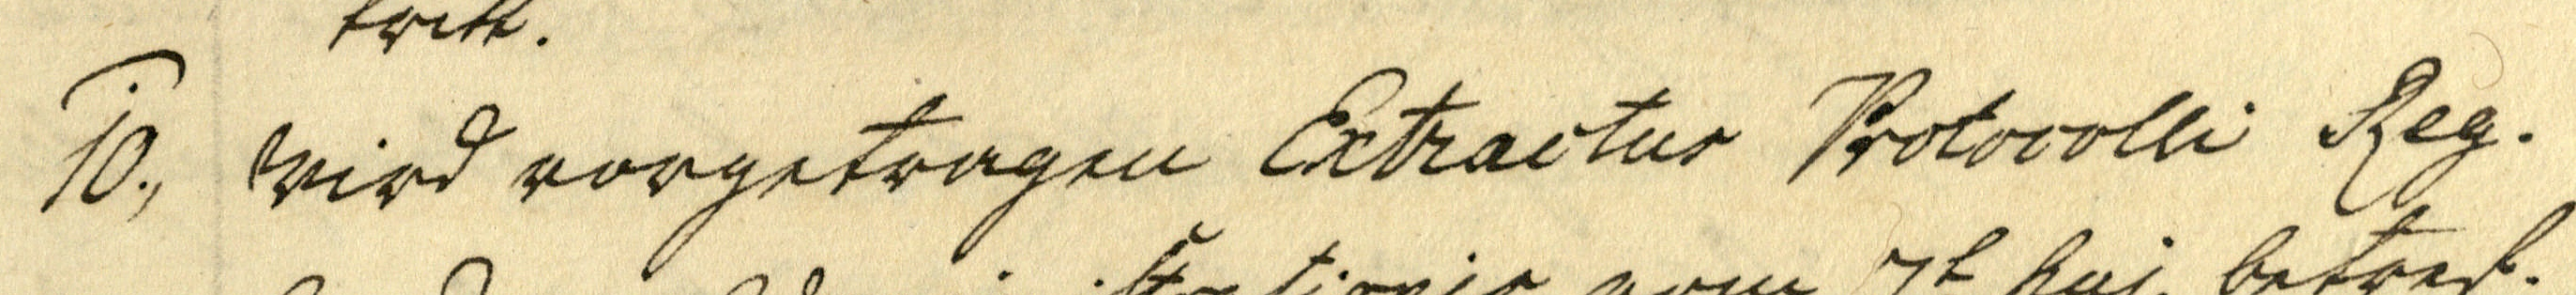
10., Wird vorgetragen Extractus Protocolli Reg.
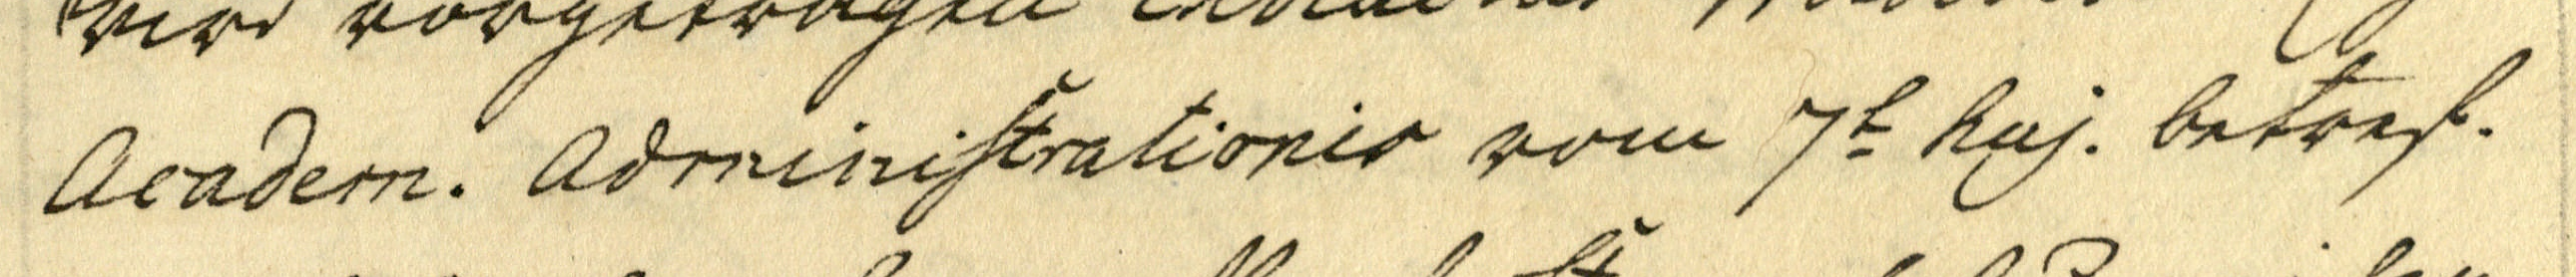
Academ. Administrationis vom 7 t huj. betref¬
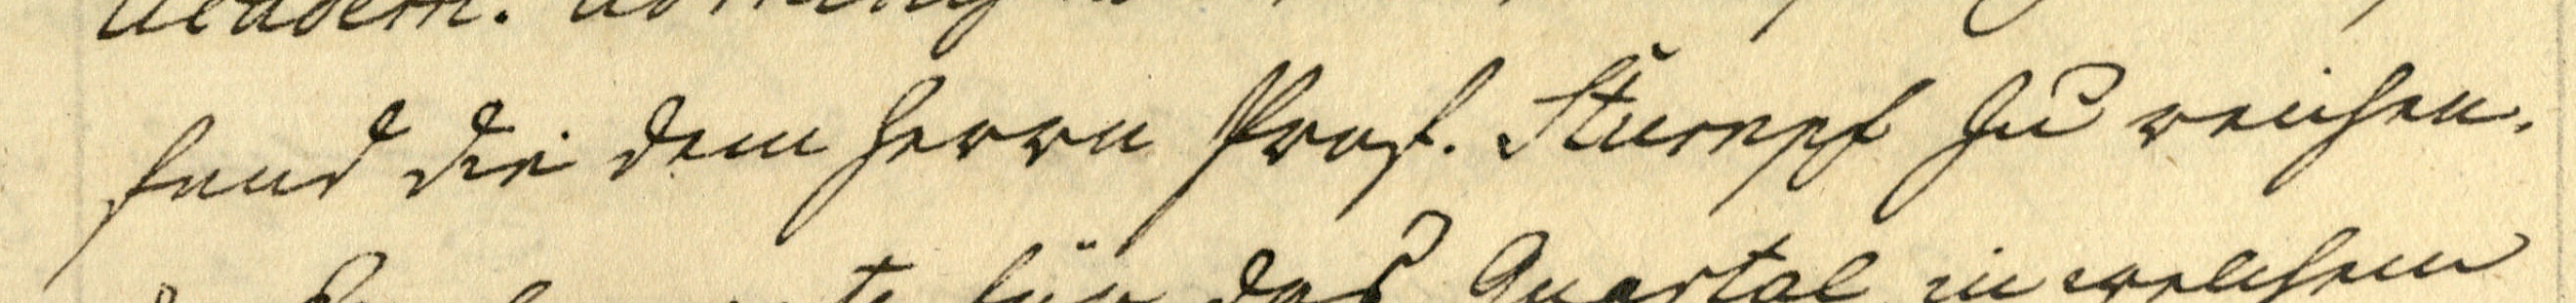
fend die dem Herrn Prof. Stumpf zu reichen¬
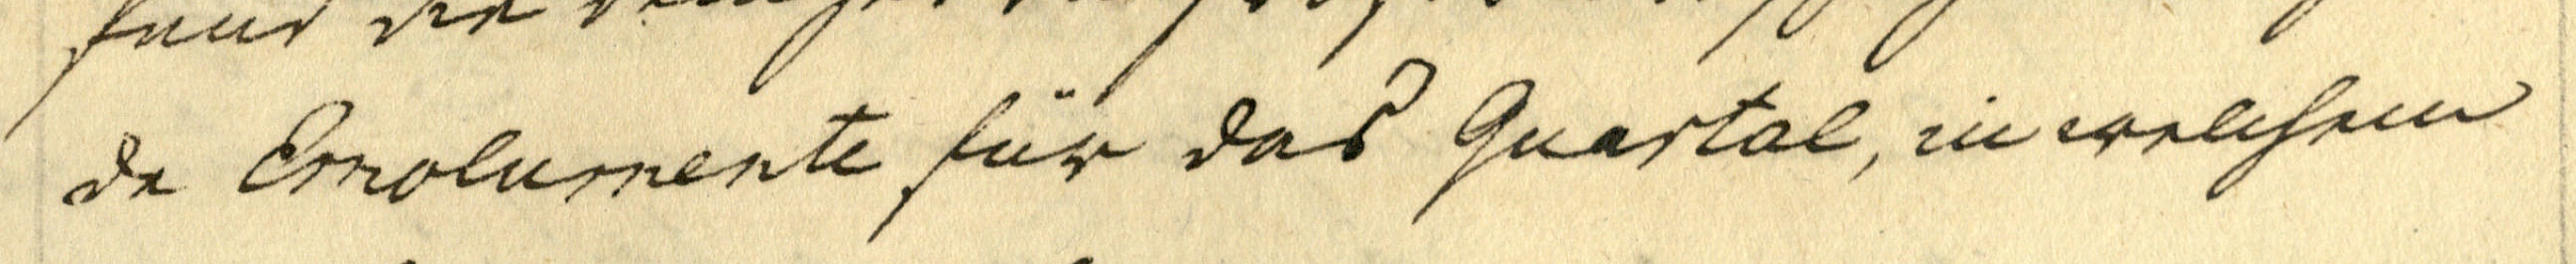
de Emolumente für das Quartal, in welchem
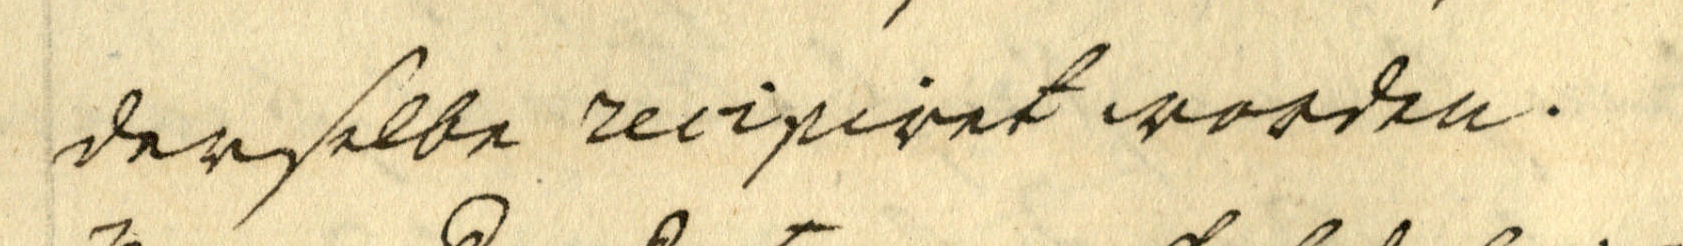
derselbe recipiret worden.
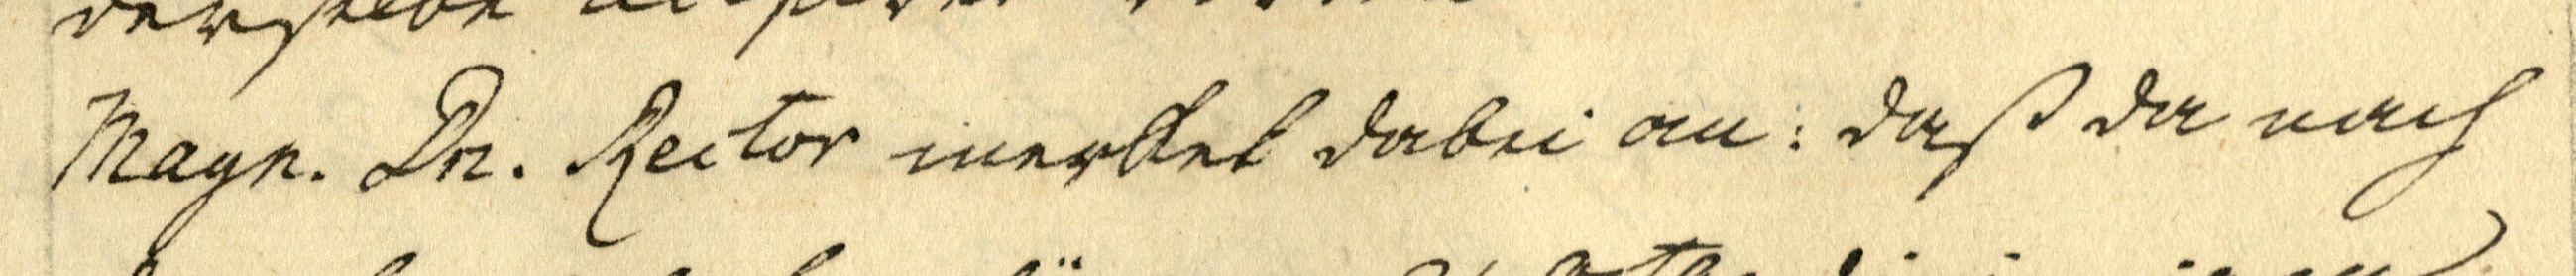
Magn. Dn. Rector merket dabei an: daß da nach
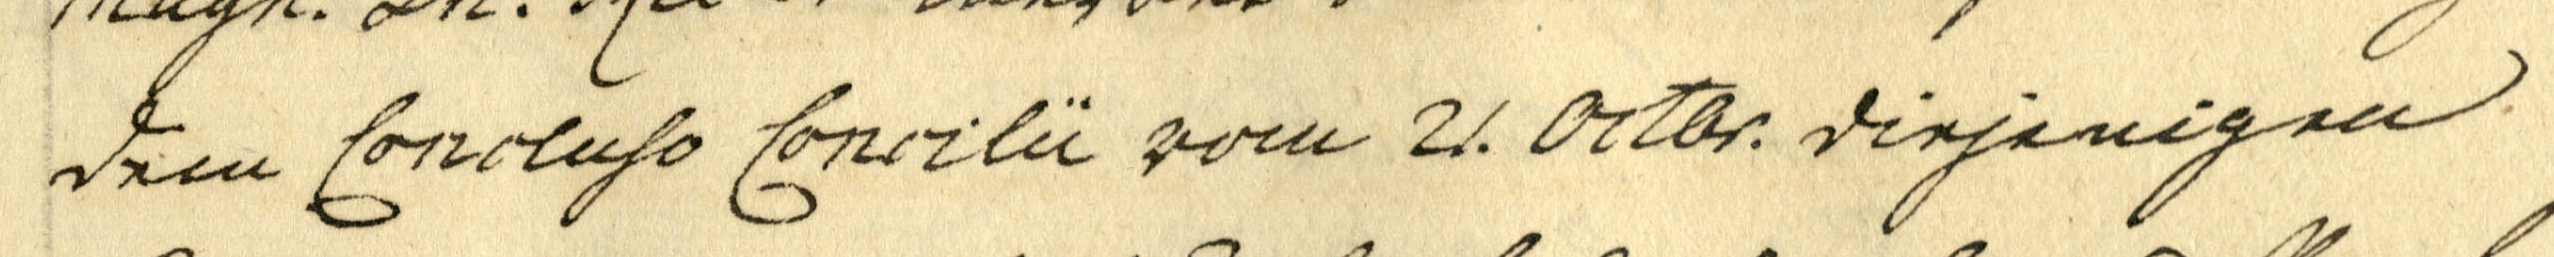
dem Concluso Concilii vom 21. Octbr. diejenigen
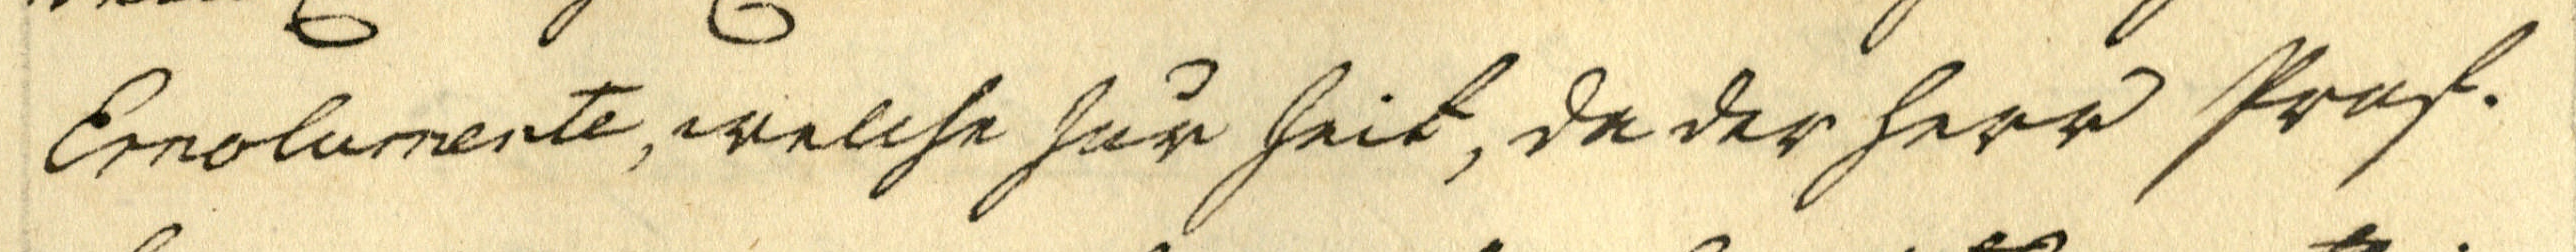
Emolumente, welche zur Zeit, da der Herr Prof.
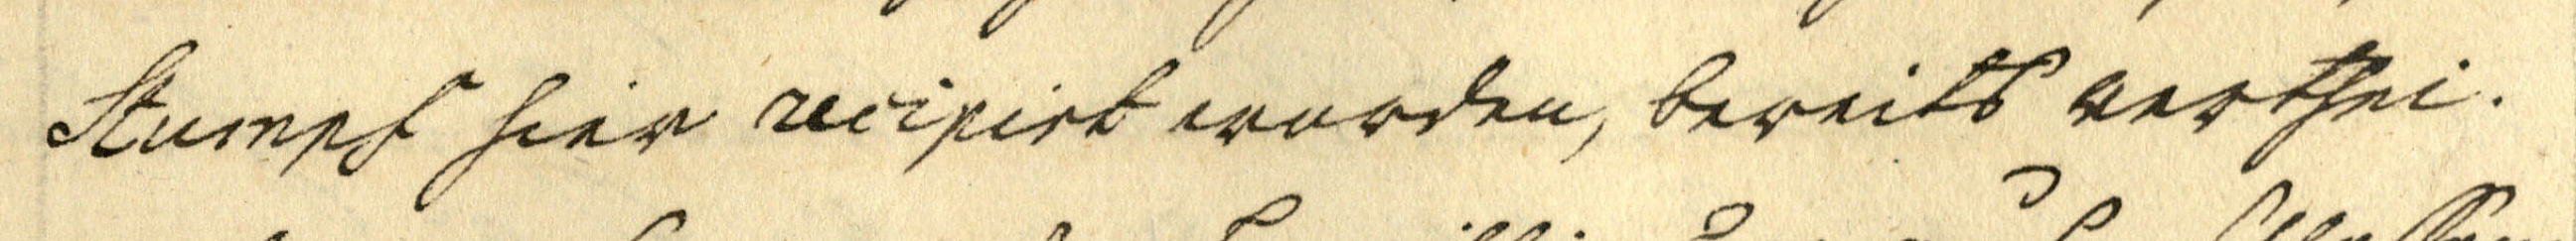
Stumpf hier recipirt worden, bereits verthei¬
